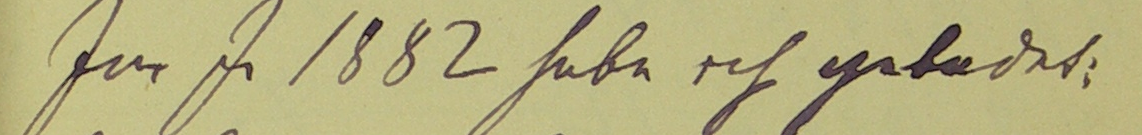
Im Jahr 1882 habe ich gebadet:
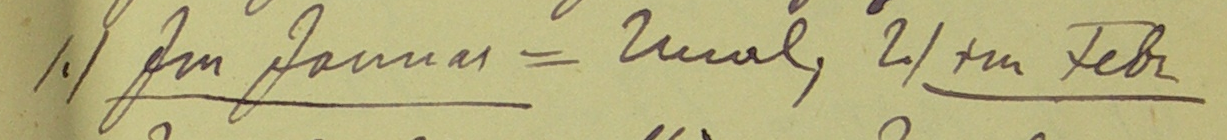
1) Im Januar = 2 mal: 2) Im Feb¬
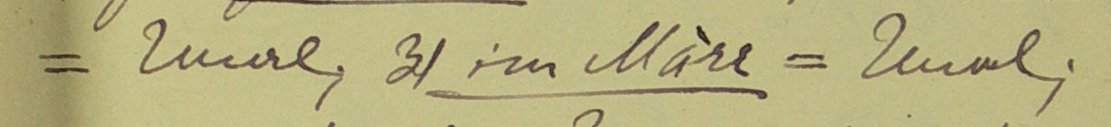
ruar =2 mal. 3) Im März = 2 mal;
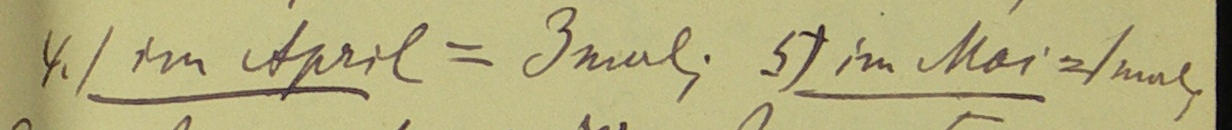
4) Im AprilI = 3 mal: 5) im Mai= 1 mal.
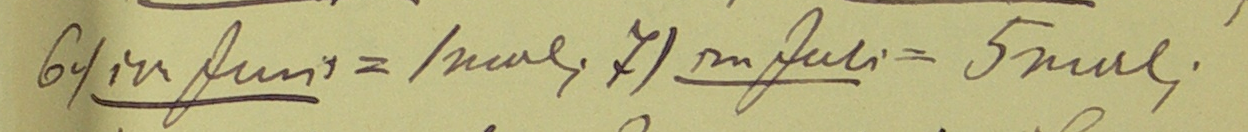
6) im Juni = 1 mal; 7) im Juli= 5 mal;
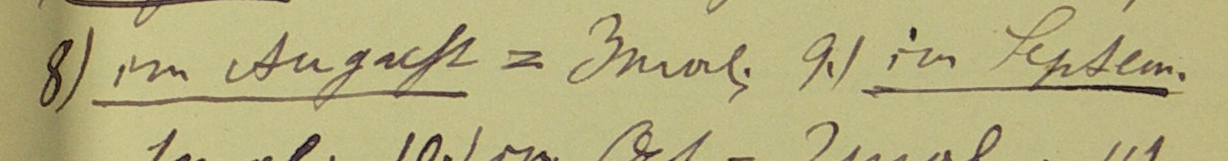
8) im August = 3 mal; 9) im Septem.
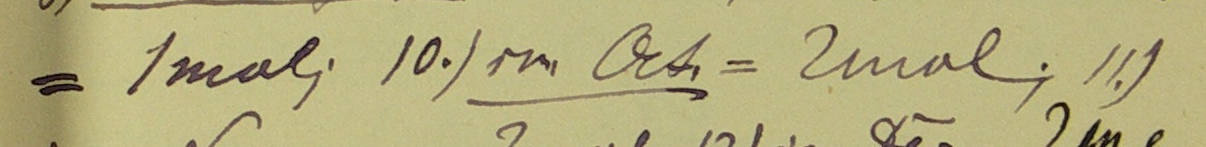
=1 mal 10) im Octob. = 2 mal; 11)
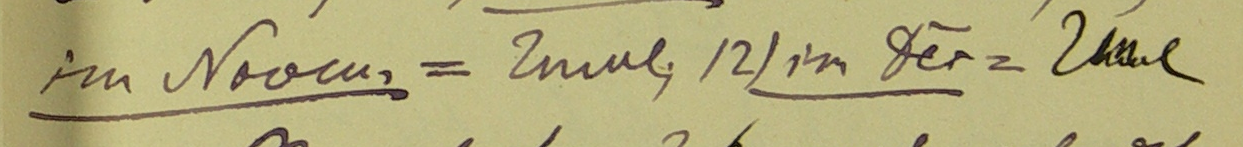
im Novemb. = 2 mal; 12) im Dec. = 2 mal;
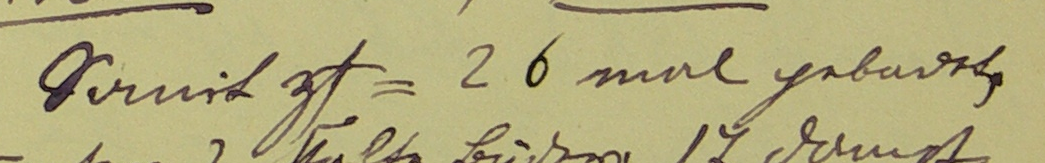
Somit zusammen = 26 mal gebadet ,
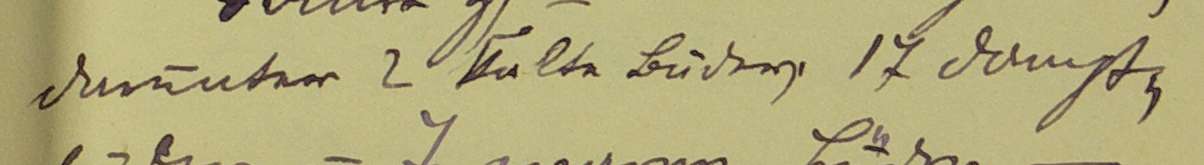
darunter 2 kalte Bäder, 17 Dampf¬
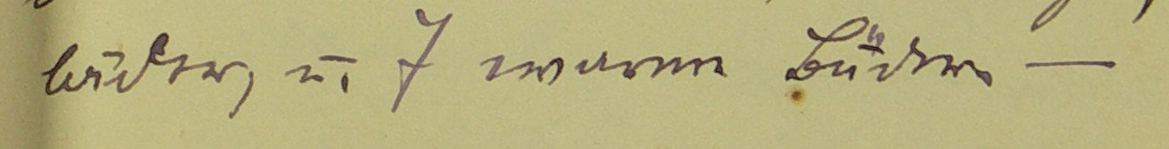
bäder und 7 warme Bäder.---
